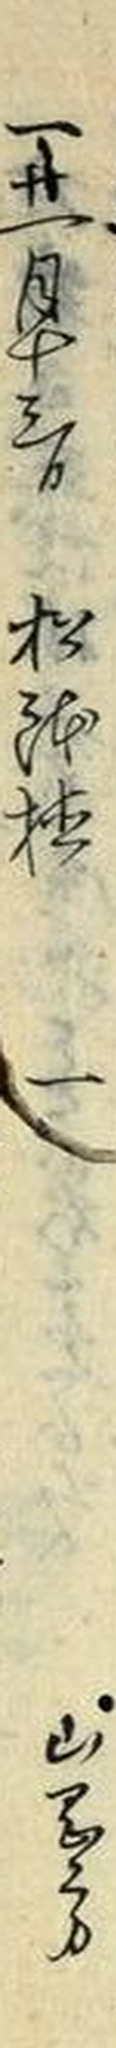一十一月十三日松鉢植一山岡方
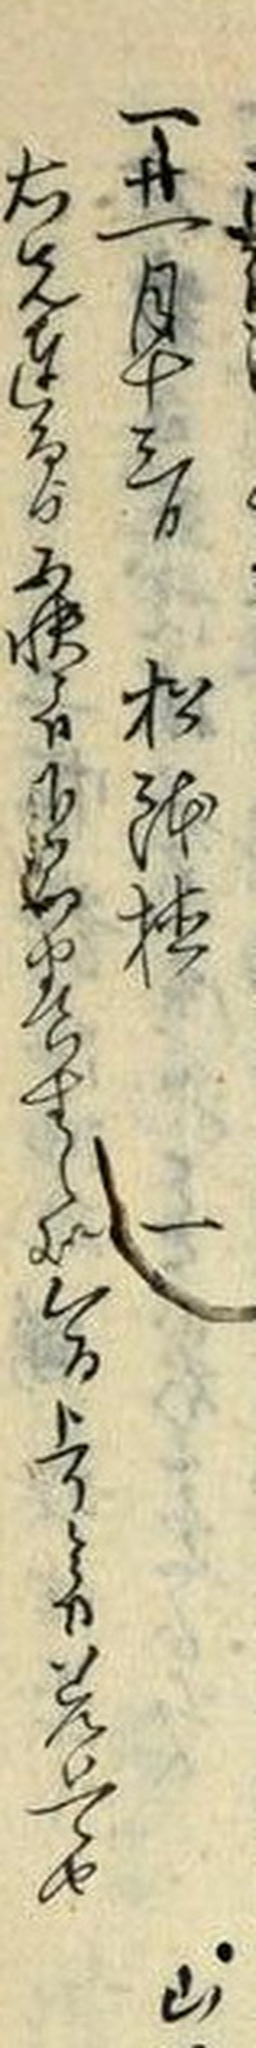右先達而ゟ不快ニ付下宿養生候処今日上り候ニ付差上候由

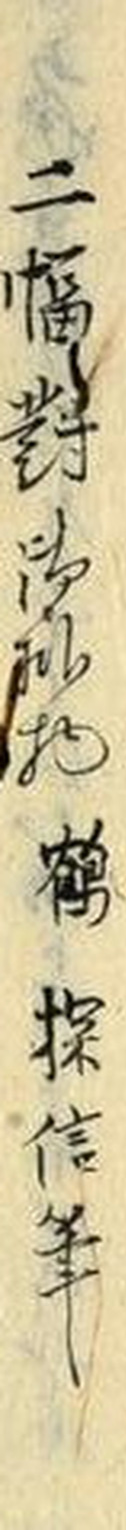二幅対御掛物鶴探信筆
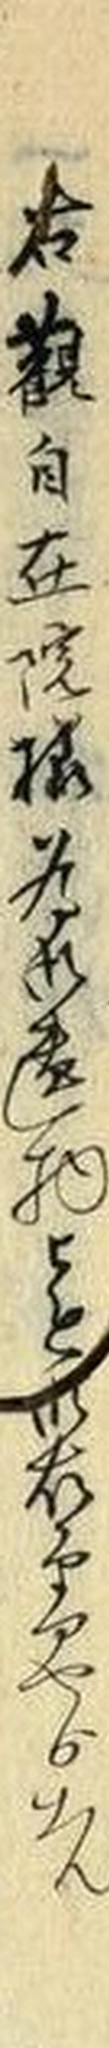右観自在院様為御遺物被進御右筆部やゟ出ㇽ
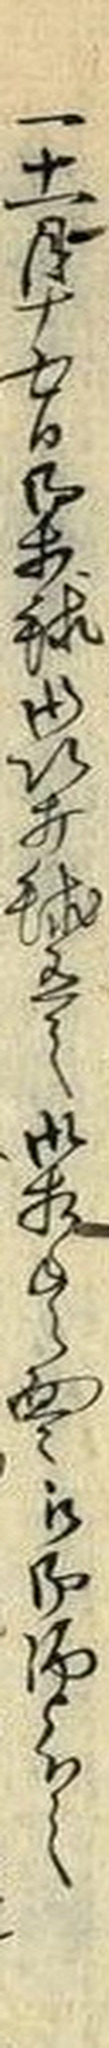一十一月十五日御打毬御次打毬有之御相手之面々江御酒被下之
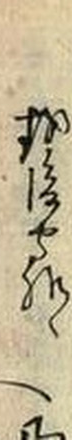越後守様へ
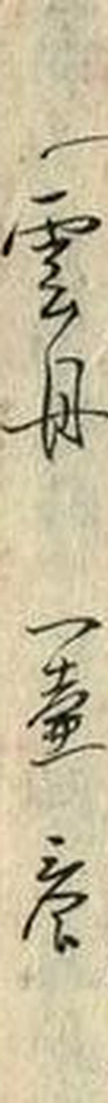雲丹一壺三合
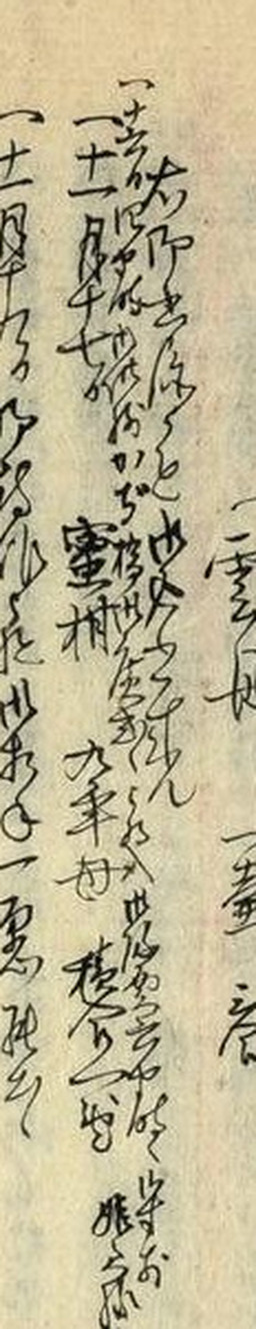一十六日四半時御供揃かぢ橋御広式へ被為入御帰殿六半時弐寸前
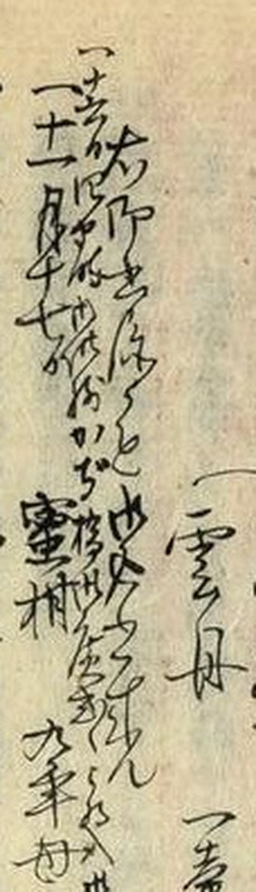右御書添被進御返書来ㇽ
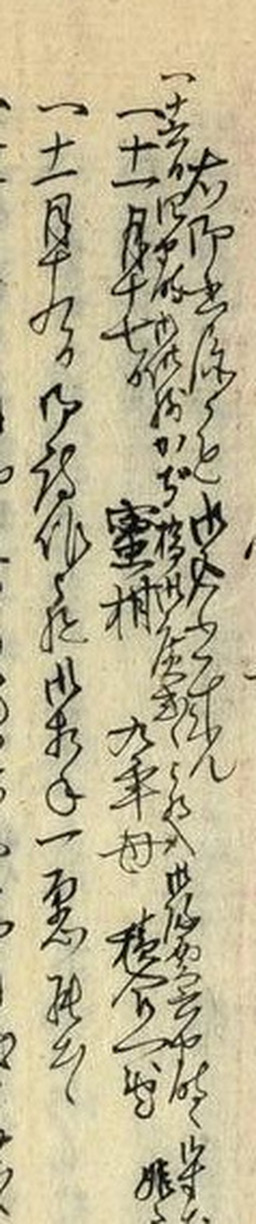一十一月十七日蜜柑九年母積合一台
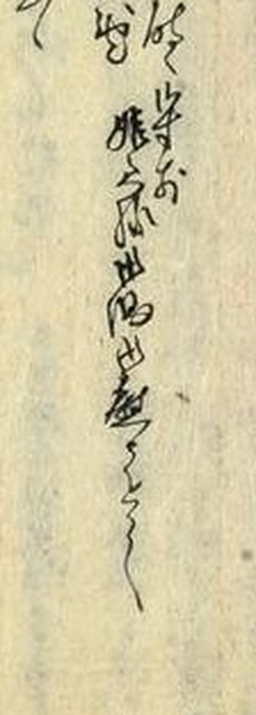姫君様御側御慰被進之
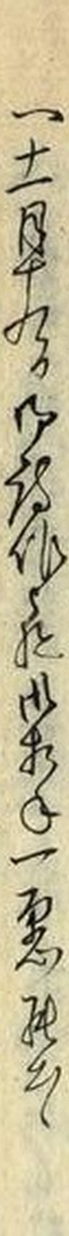一十一月十九日御詩作被遊御相手一愿罷出候
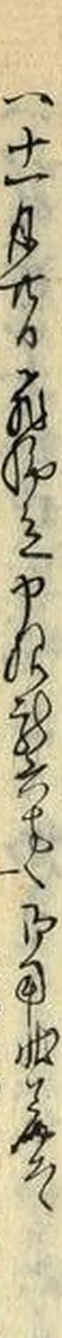一十一月廿日飛脚立中根新六方へ御用状差出候
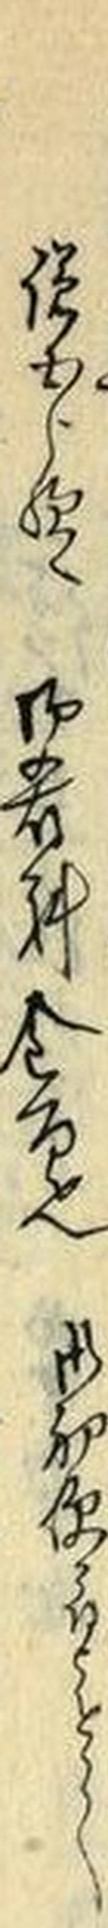謙五郎様へ御肴料金百疋御初便ニ付被進之
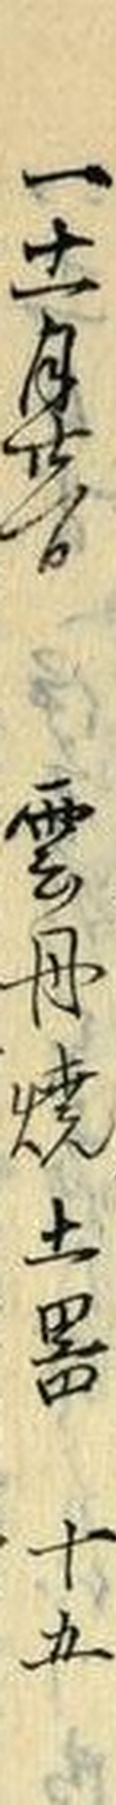一十一月廿一日雲丹焼土器十五
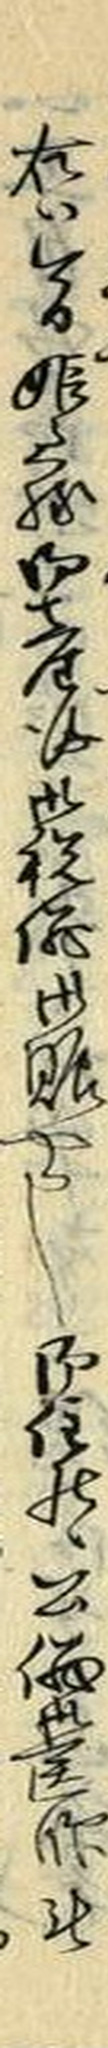右ハ今日姫君様御産後御祝儀御賑やかし御住居へ公儀御医師被
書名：少傅日録抄（斉承付側向頭取日記、在府）
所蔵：福井県文書館 Fukui Prefectural Archives
